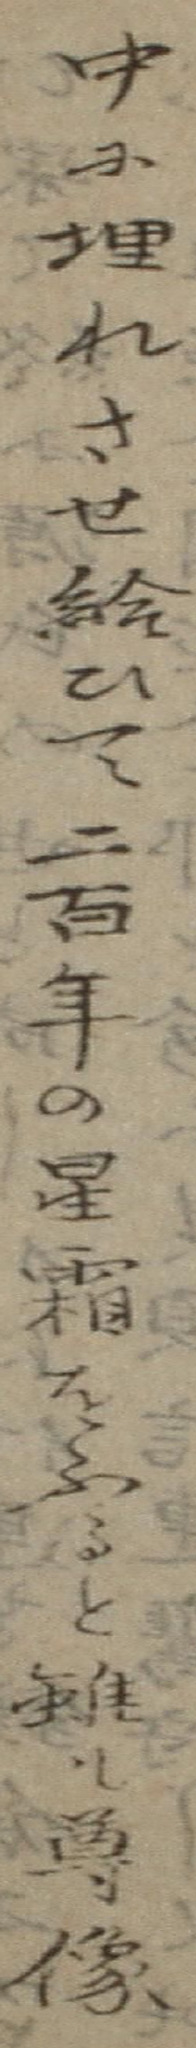中に埋れさせ給ひて二百年の星霜をふると雖も尊像
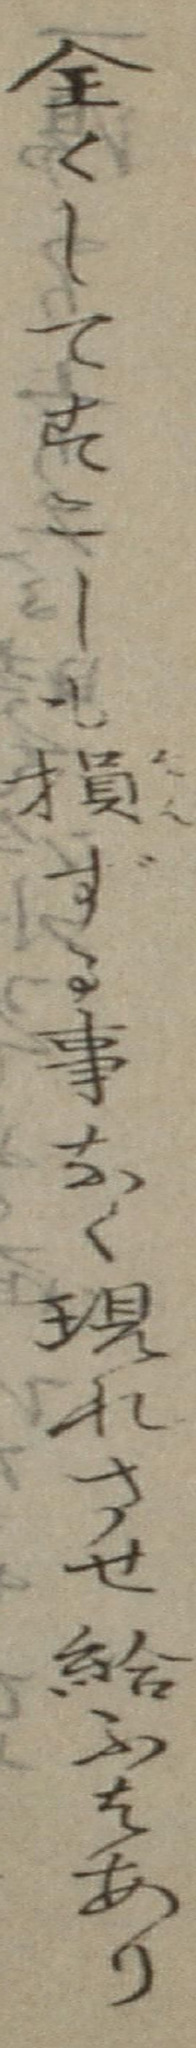全くしてすこしも損ずる事なく現れさせ給ふはあり
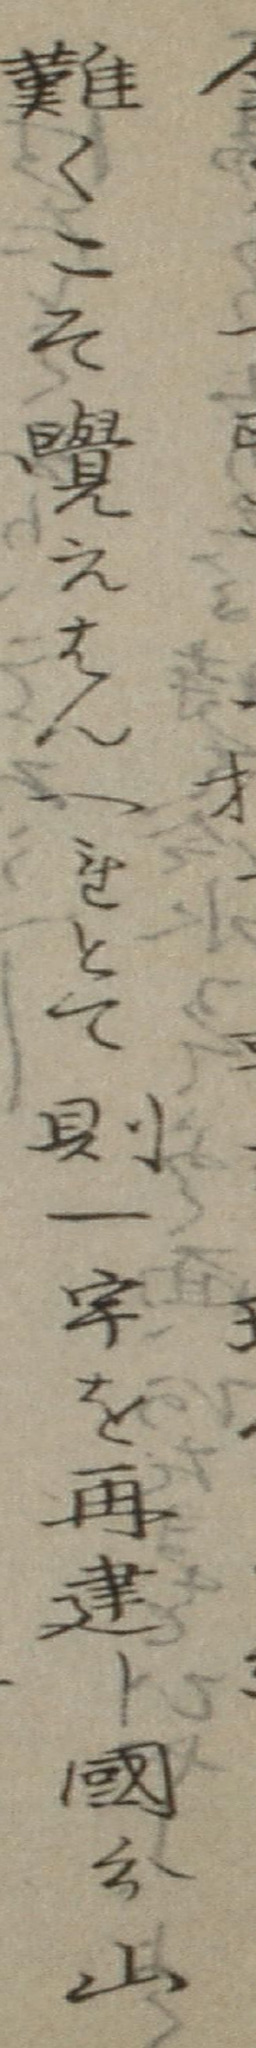難くこそ覚えはんへれとて則一宇を再建し国分山
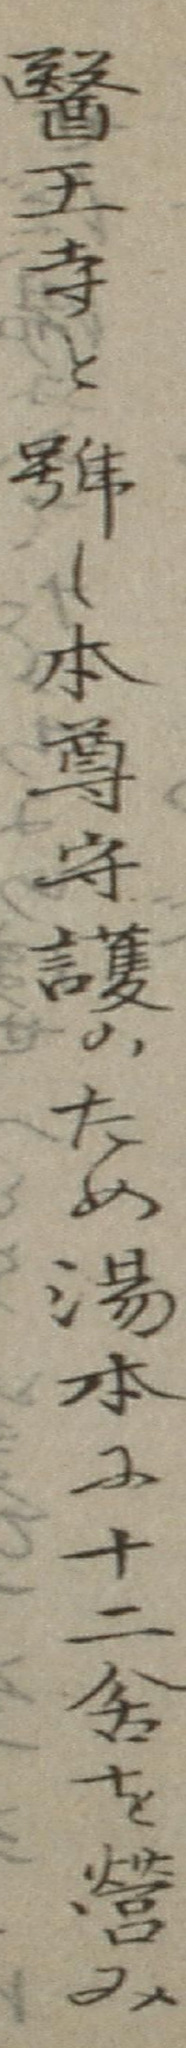医王寺と号し本尊守護のため湯本に十二舎を営み
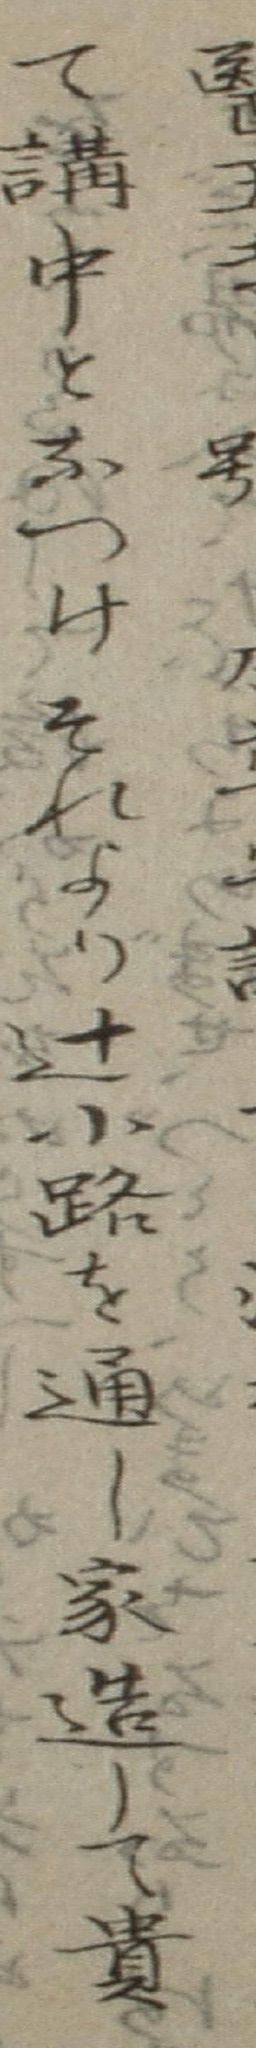て講中となつけそれより辻小路を通し家造りて貴
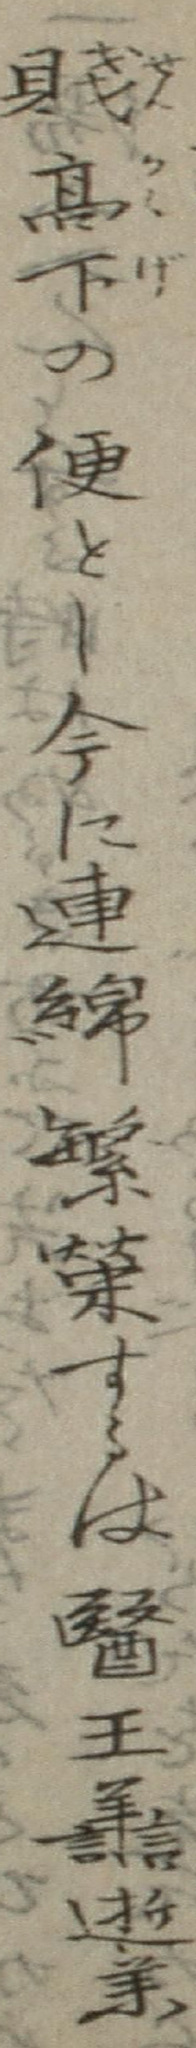賤高下の便とし今に連綿繁栄するは医王善逝薬
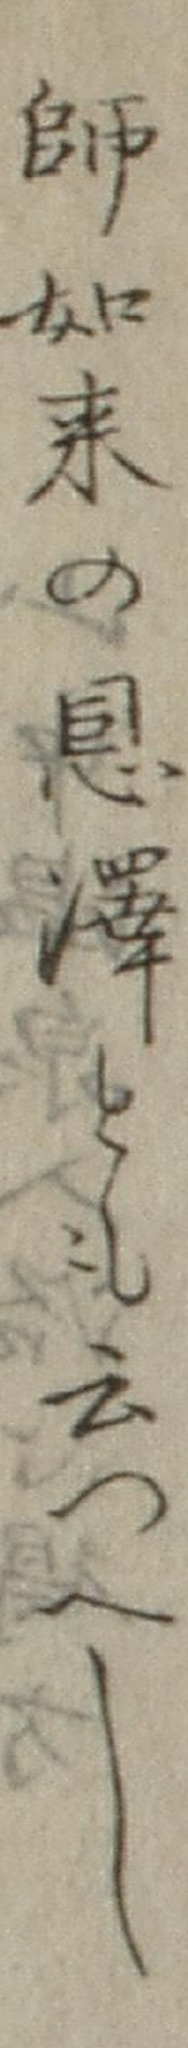師如来の恩沢とも云つへし

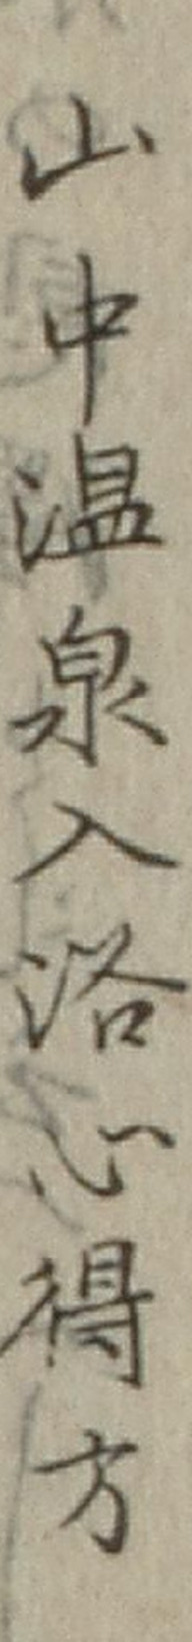山中温泉入浴心得方
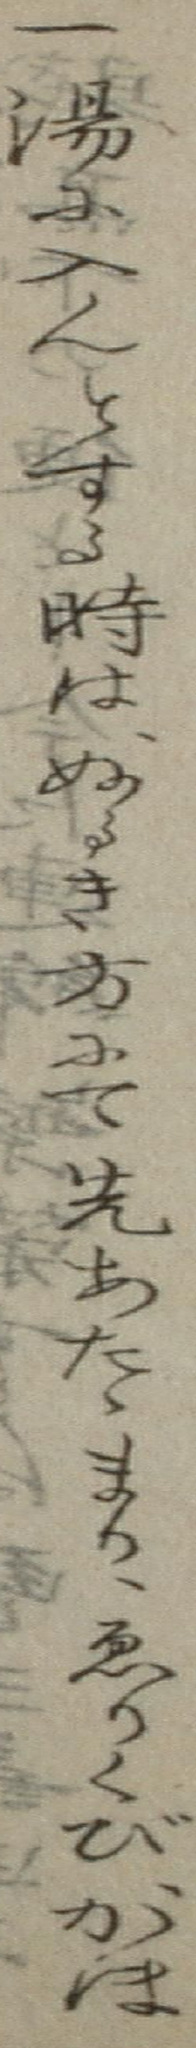一湯に入んとする時は、ぬるき方にて先あたゝまり、ゑりくび、かほ
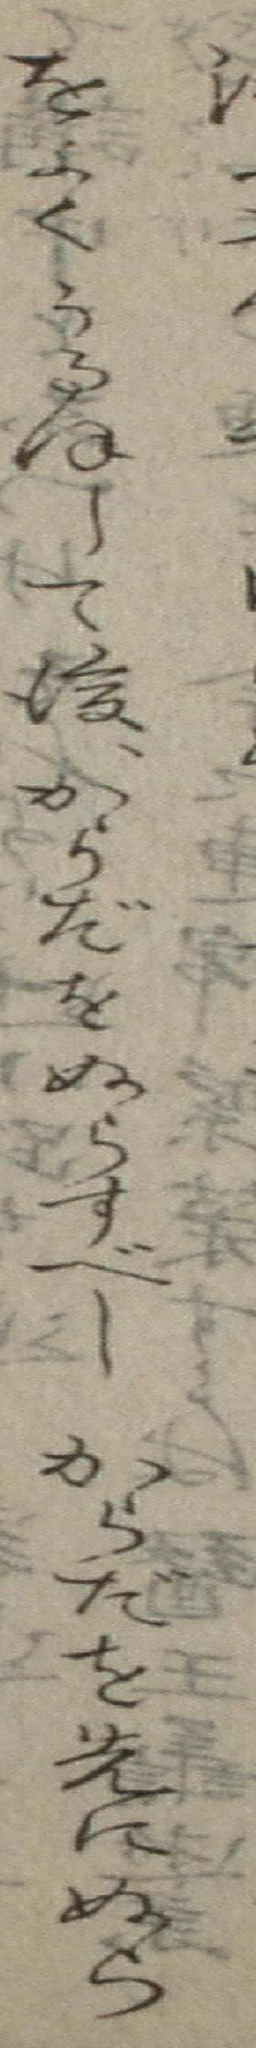をよくうるほして後、からだをぬらすべしからだを先にぬら
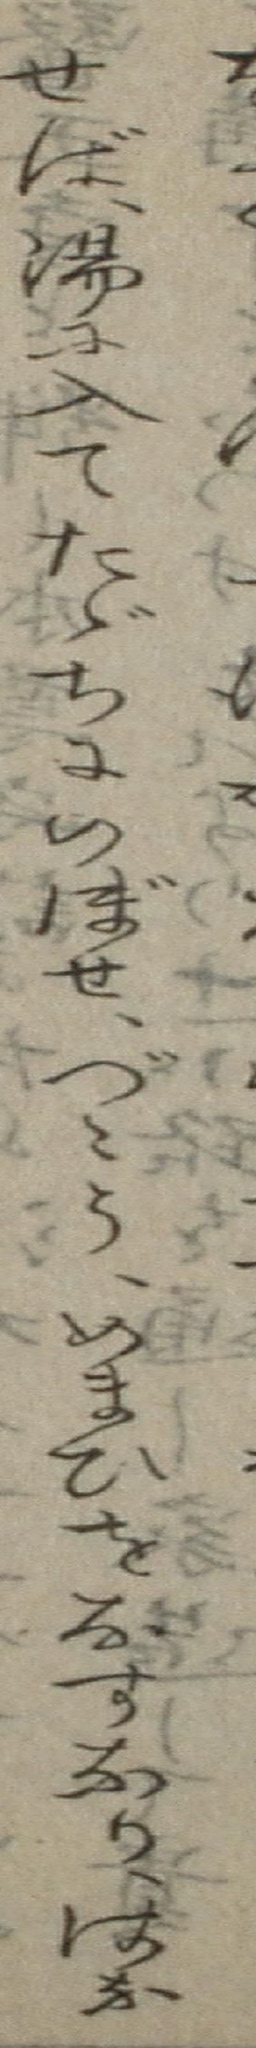せば、湯に入てたゞちにのぼせ、づゝう、めまひをなすなり、はな
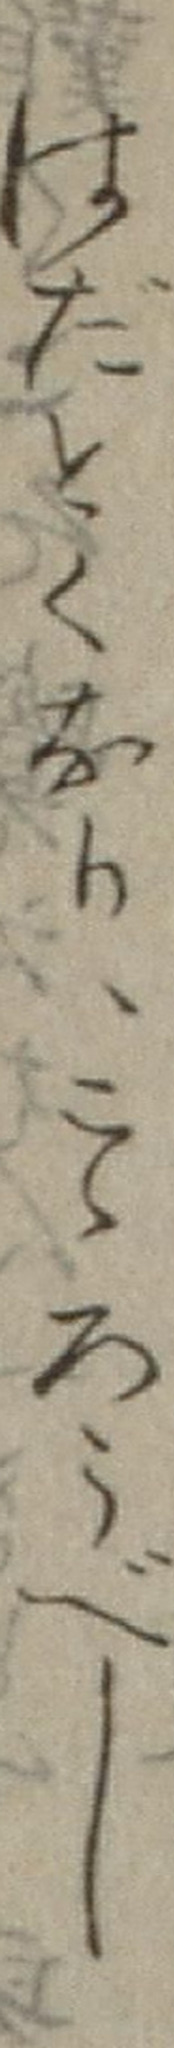はだとくなり、こゝろうべし
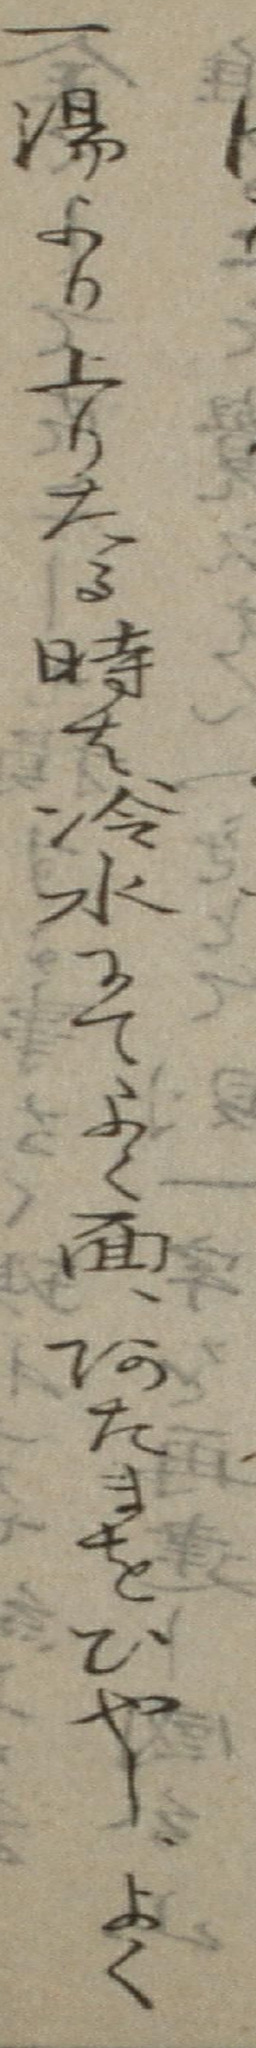一湯より上りたる時は、冷水にてよく面、あたまをひやし、よく
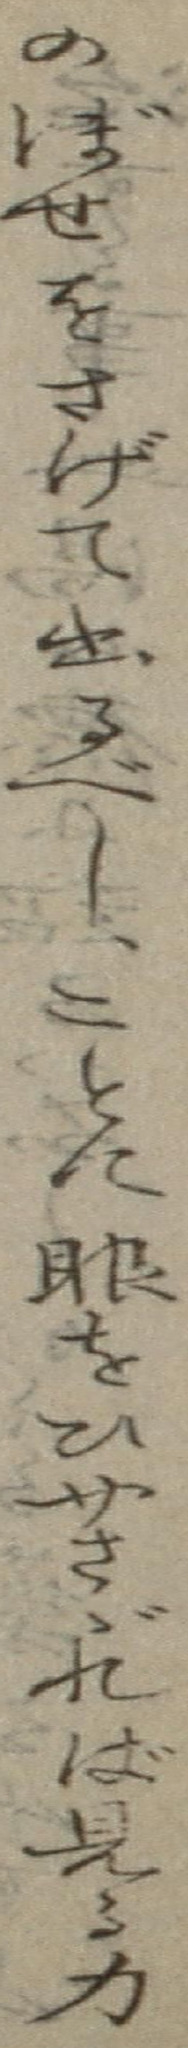のぼせをさげて出るべし、ことに眼をひやさゞれば見る力
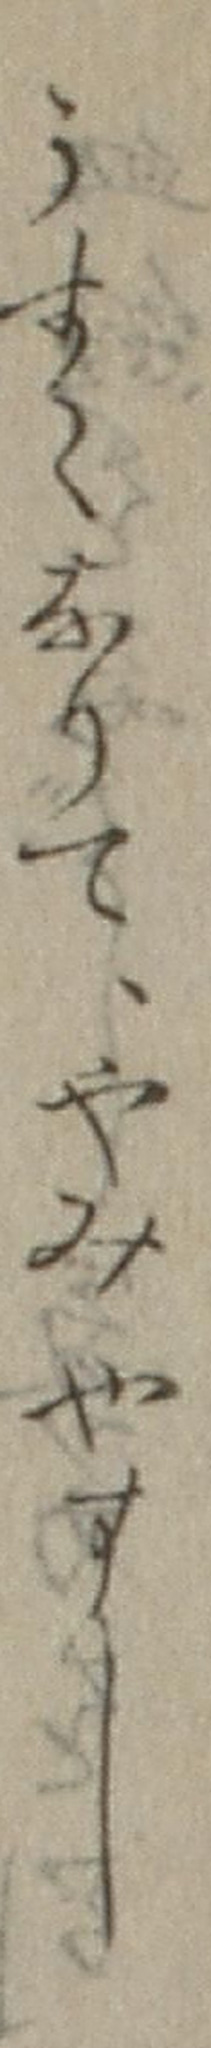うすくなりて、やみやすし
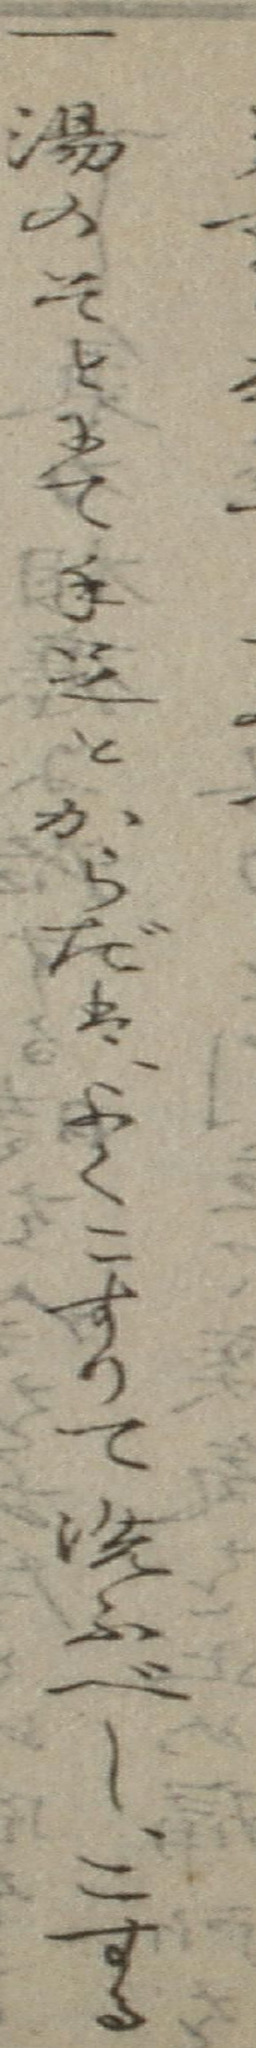一湯のそとにて手足とからだは、よくこすりて洗ふべし、こする
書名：山中温泉縁記并ニ入浴之心得
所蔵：東京大学地震研究所図書室 Earthquake Research Institute Library, The University of Tokyo, JAPAN
